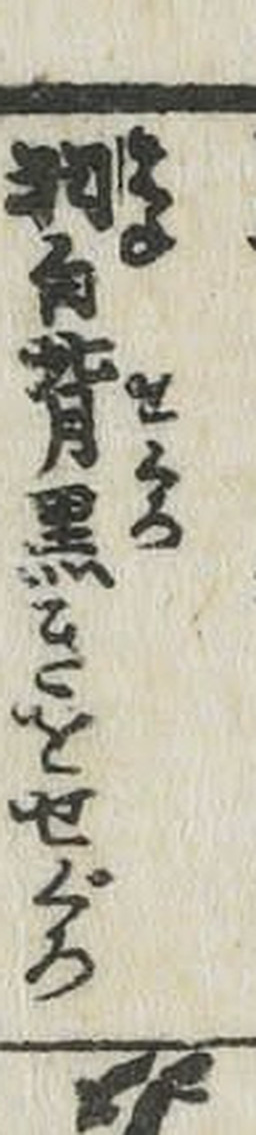羽白背黒きをせぐろ
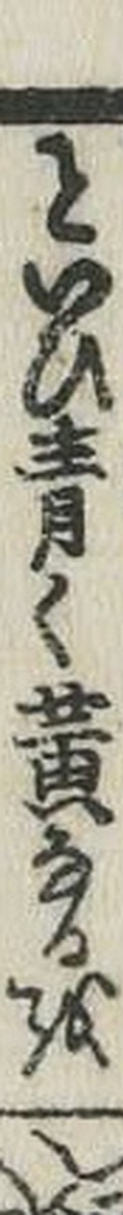といひ青く黄なるを
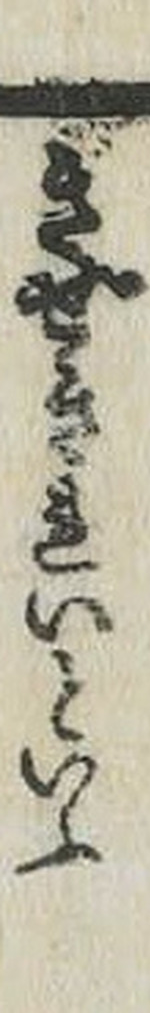きぜきれいといふ

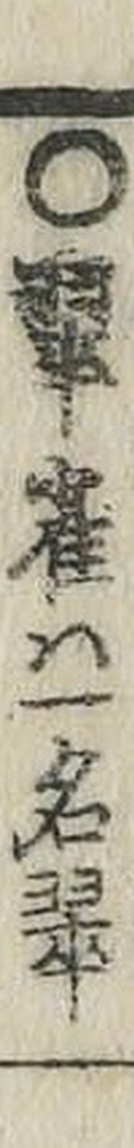○翠雀は一名翠
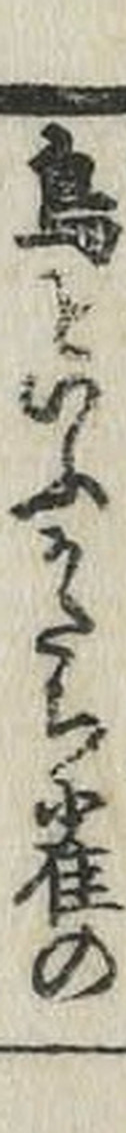鳥といふかたち雀の
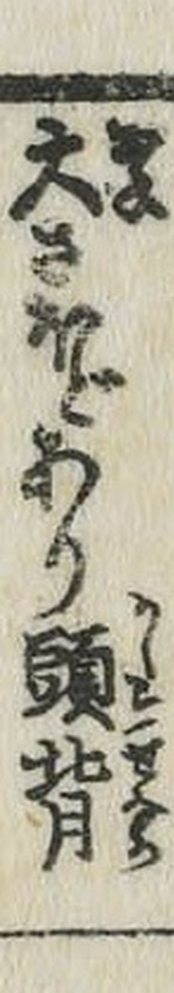大さほどあり頭背
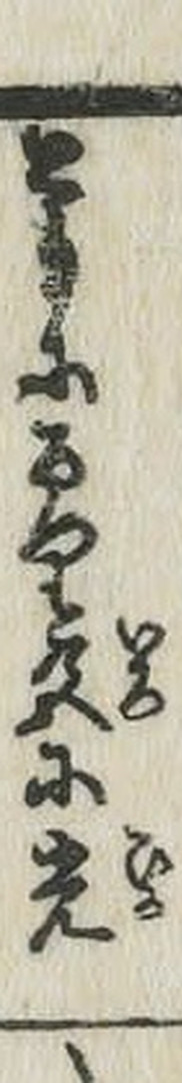ともにるり色に光
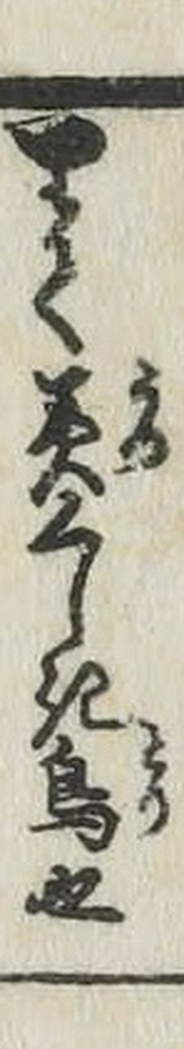りて美くしき鳥也
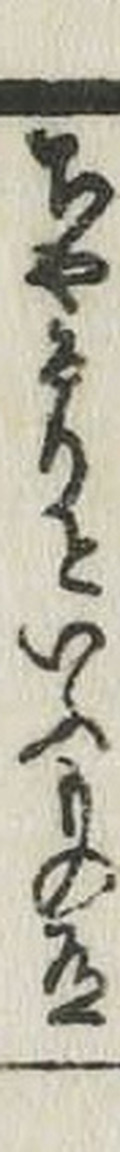ちやるりといふもの有
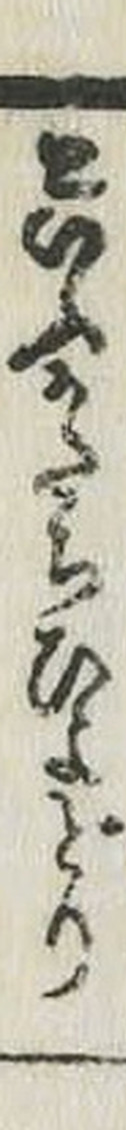といふかたちひよどり
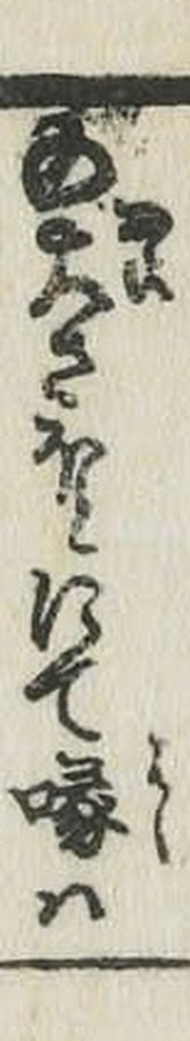の大さほとにて喙は
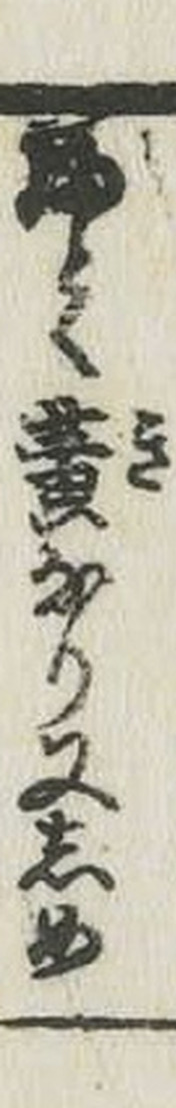ふとく黄なり又しめ
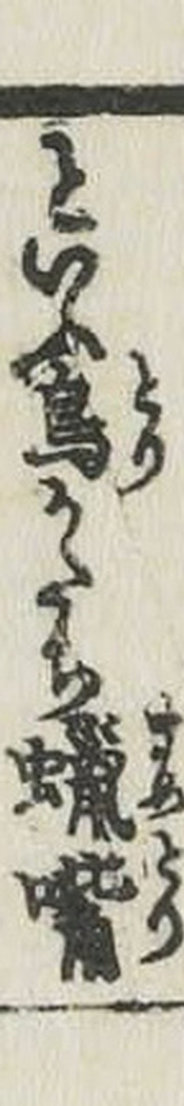といふ鳥かたち蝋嘴
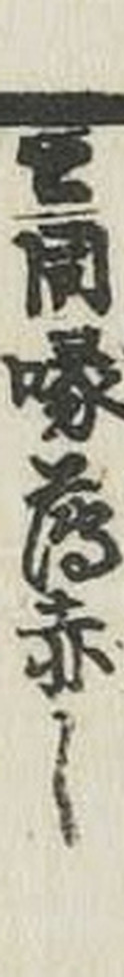と同喙薄赤し
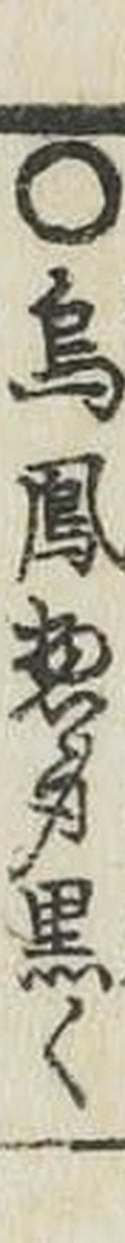○烏鳳惣身黒く
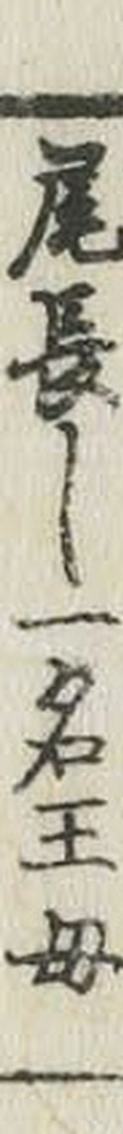尾長し一名王母
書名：増補頭書訓蒙図彙大成 10巻 6:巻之12-13
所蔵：東京学芸大学教育コンテンツアーカイブ
